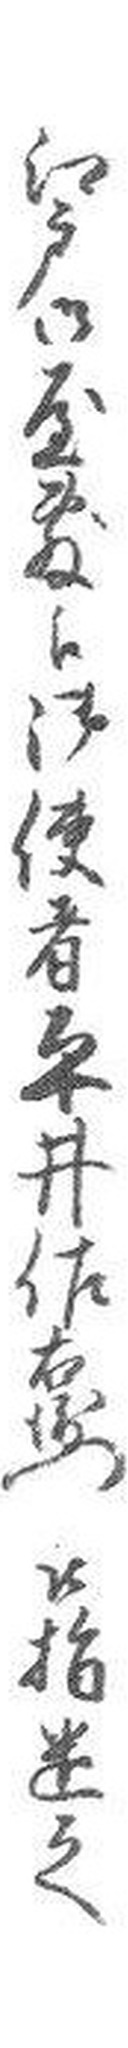江戸御屋敷江御使者平井佐右衛門被指遣之
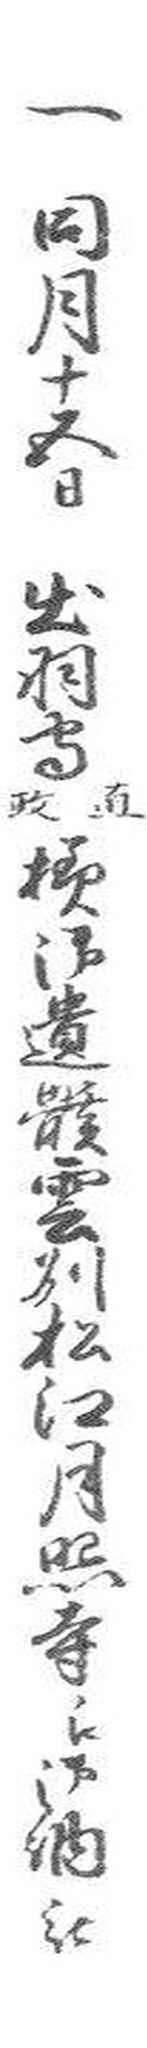一同月十五日出羽守直政様御遺骸雲州松江月照寺江御納被
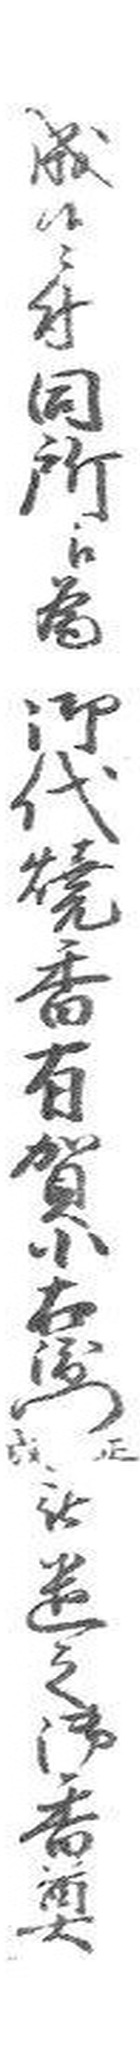成候ニ付同所江為御代焼香有賀小右衛門正成被遣之御香奠
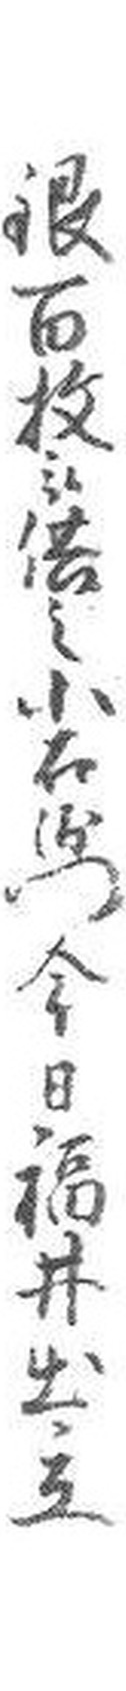銀百枚被供之小右衛門今日福井出立
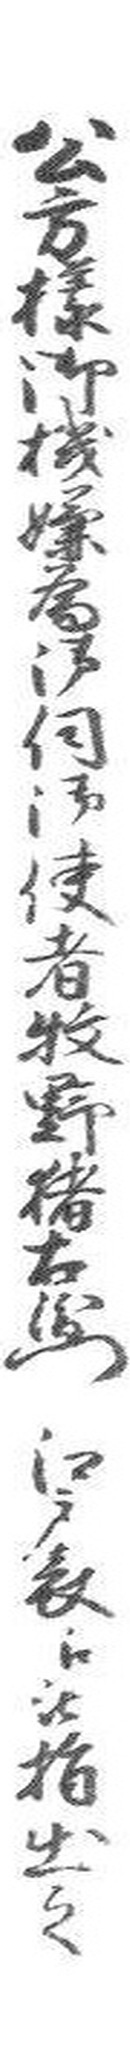公方様御機嫌為御伺御使者牧野猪右衛門江戸表江被指出之
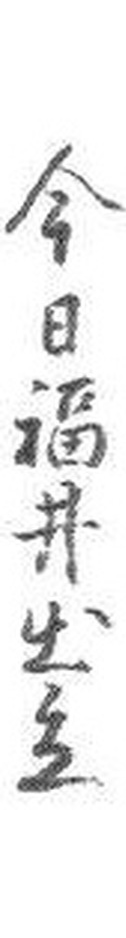今日福井出立
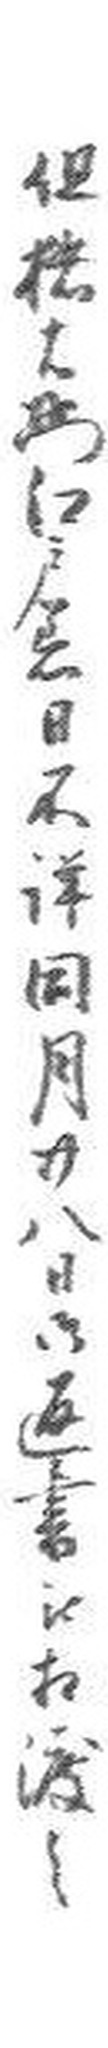但猪右衛門江戸着日不詳同月廿八日御返書被相渡之
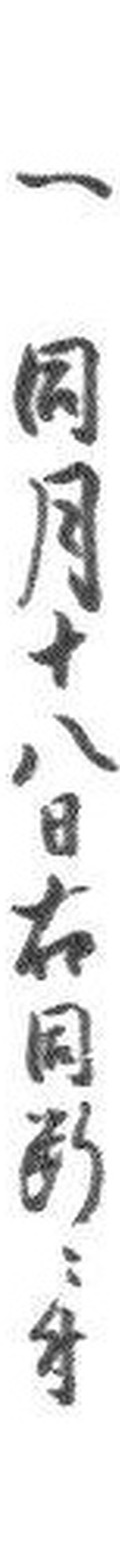一同月十八日右同断ニ付
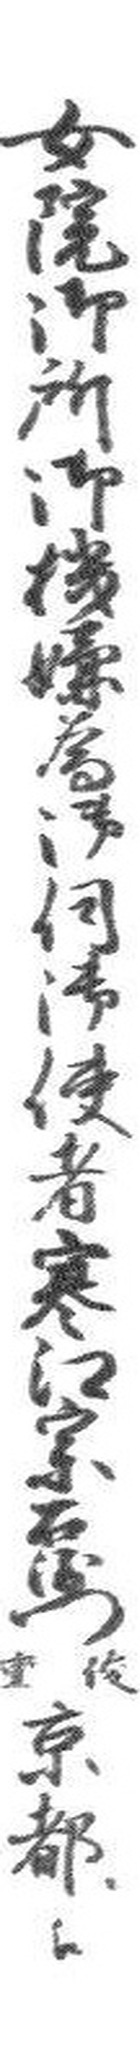女院御所御機嫌為御伺御使者寒江宗右衛門俊重京都江
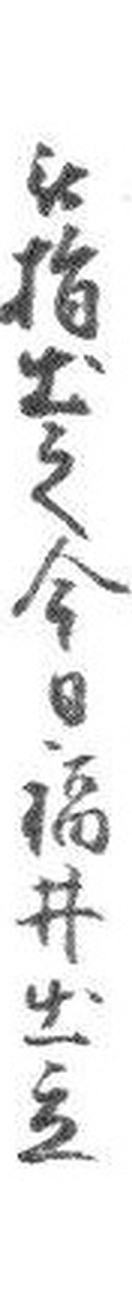被指出之今日福井出立
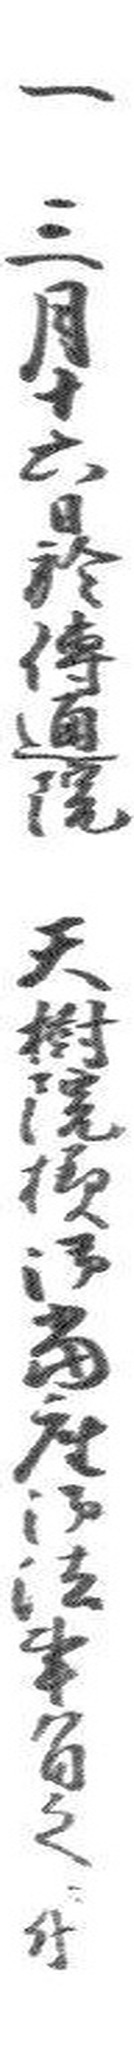一三月十六日於伝通院天樹院様御当座御法事有之ニ付
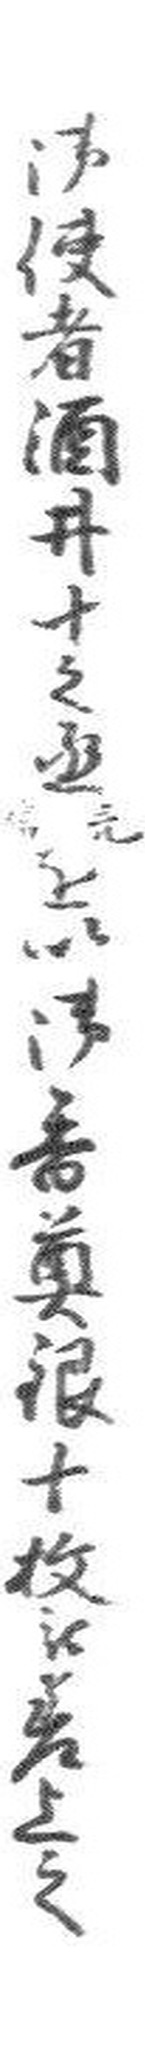御使者酒井十之丞信を以御香奠銀十枚被差上之
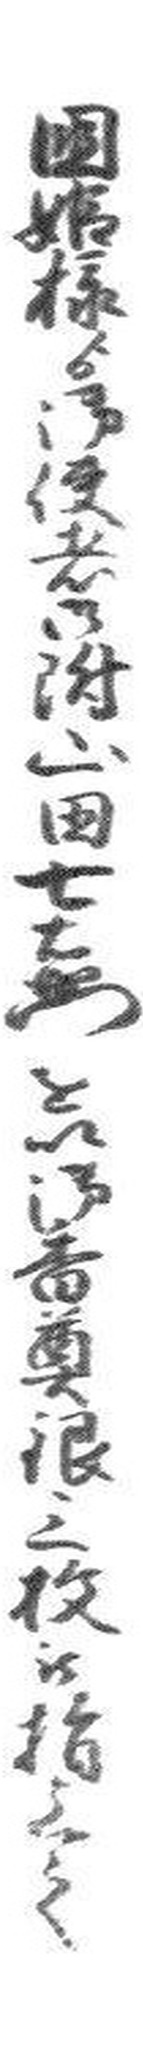国姫様ゟ御使者御附山田七右衛門を以御香奠銀三枚
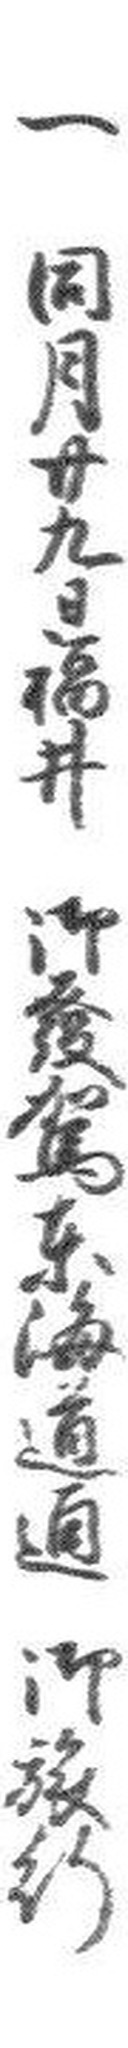一同月廿九日福井御発駕東海道通御旅行
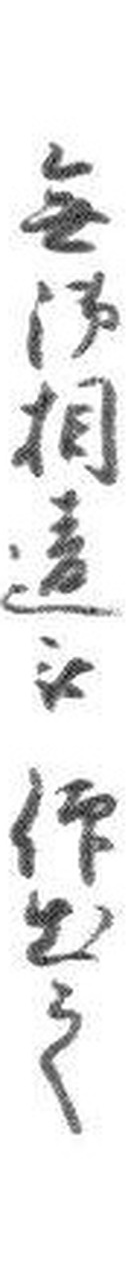無御相違被仰出之

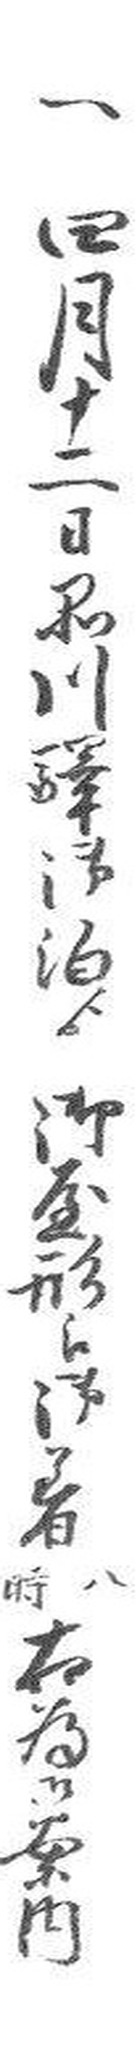一四月十二日品川駅御泊ゟ御屋形江御着八時右為御案内
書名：家譜 七 光通公 従寛文四年到同九年
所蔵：福井県文書館 Fukui Prefectural Archives
